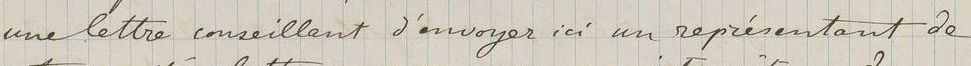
une lettre conseillant d'envoyer ici un représentant de
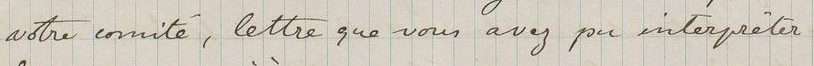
votre comité, lettre que vous avez pu interprêter de
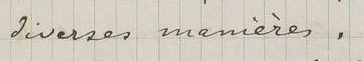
diverses manières.
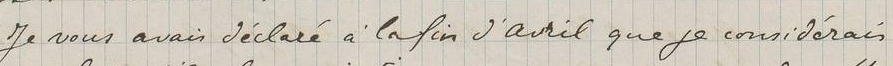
Je vous avais déclaré à la fin d'Avril que je considérais
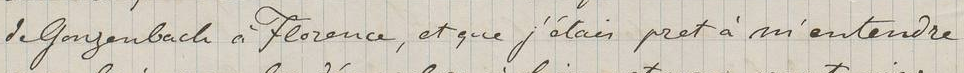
de Gonzenbach à Florence, et que j'étais pret à m'entendre
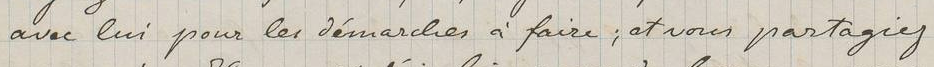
avec lui pour les démarches à faire; et vous partagiez
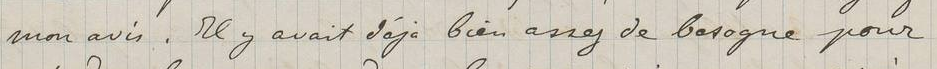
mon avis. Il y avait déja bien assez de besogne pour
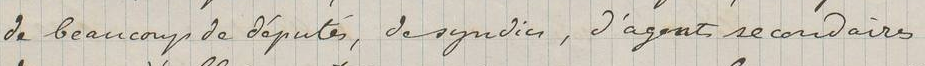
de beaucoup de députés, de syndics, d'agents secondaires,
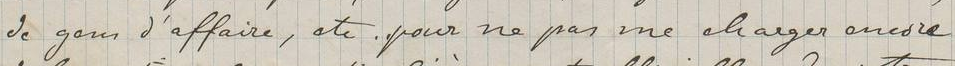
de gens d'affaire, etc. pour ne pas me charger encore
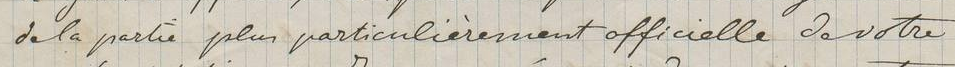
de la partie plus particulièrement officielle de votre
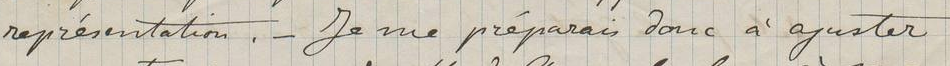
représentation. – Je me préparais donc à ajuster
